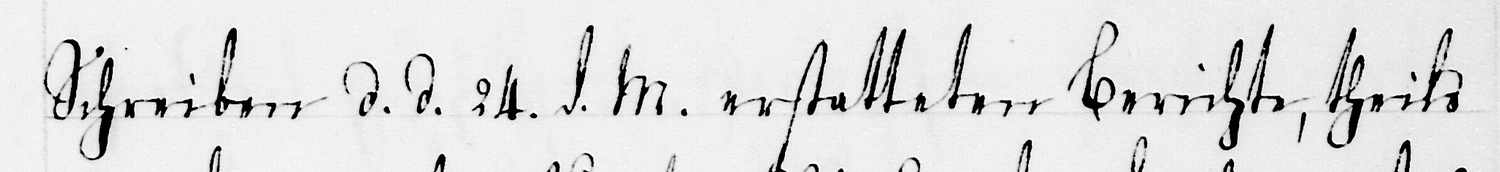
Schreiben d. d. 24. d. M. erstatteten Berichte, theils
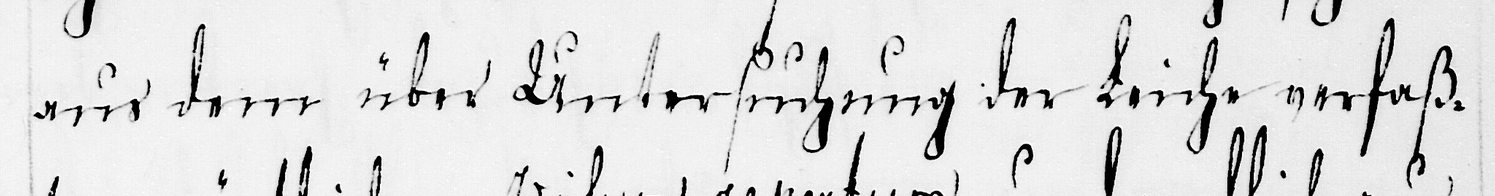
aus dem über Untersuchung der Leiche verfaß¬
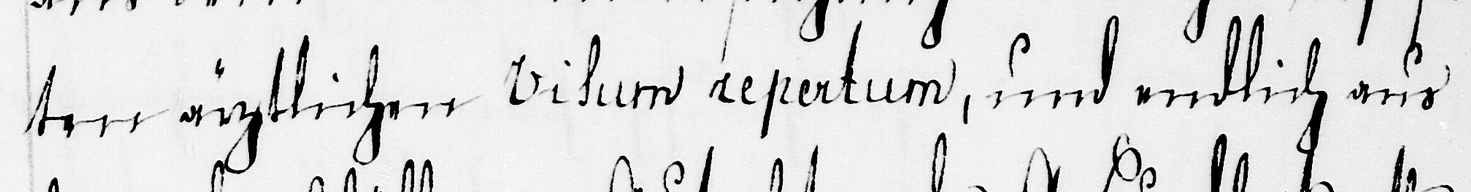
ten ärztlichen Visum repertum, und endlich aus
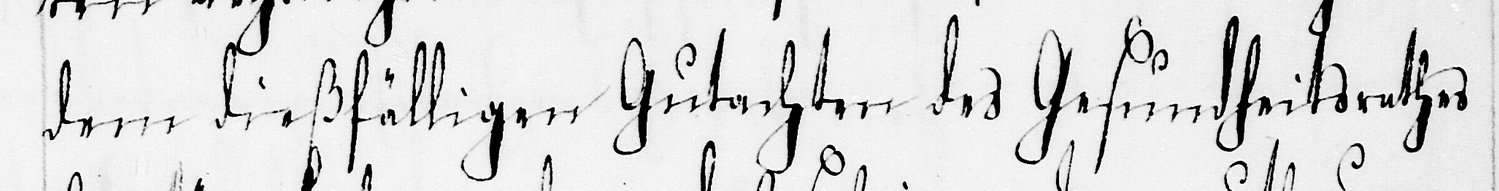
dem dießfälligen Gutachten des Gesundheitsrathes
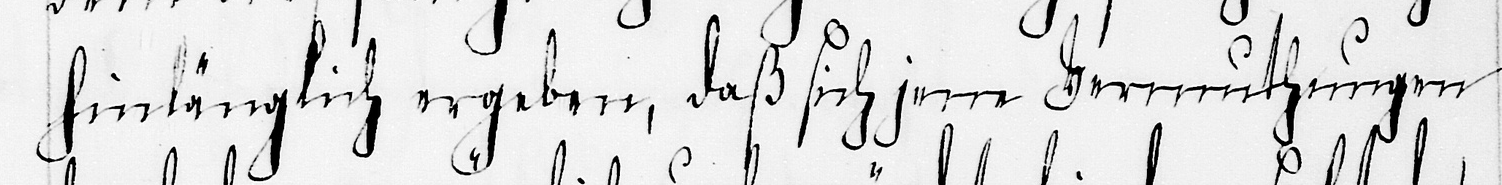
hinlänglich ergeben, das sich jene Vermuthungen
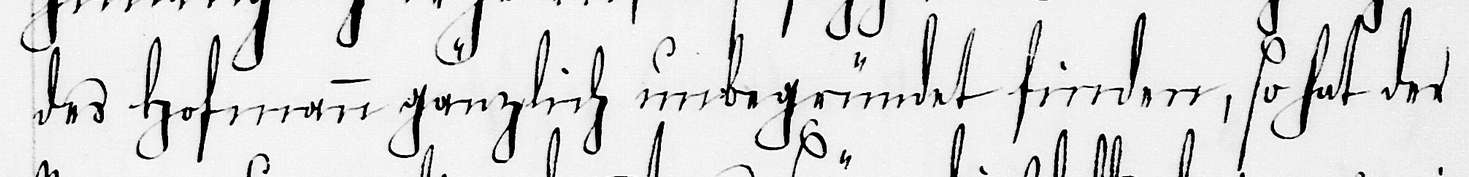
des Hofmann gänzlich unbegründet finden, so hat der
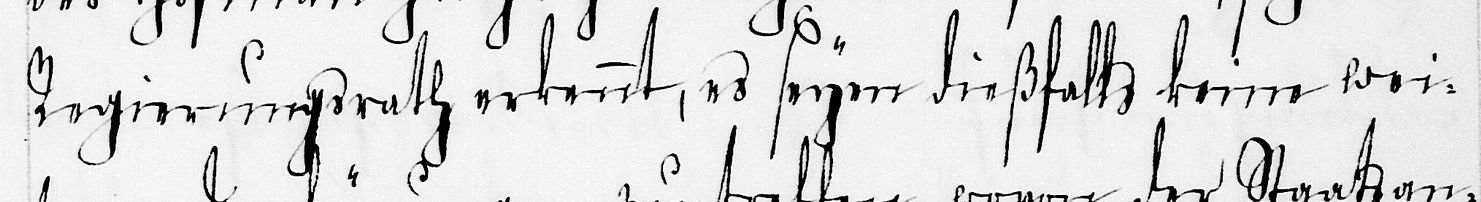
Regierungsrath erkennt, es seyen dießfalls keine wei¬
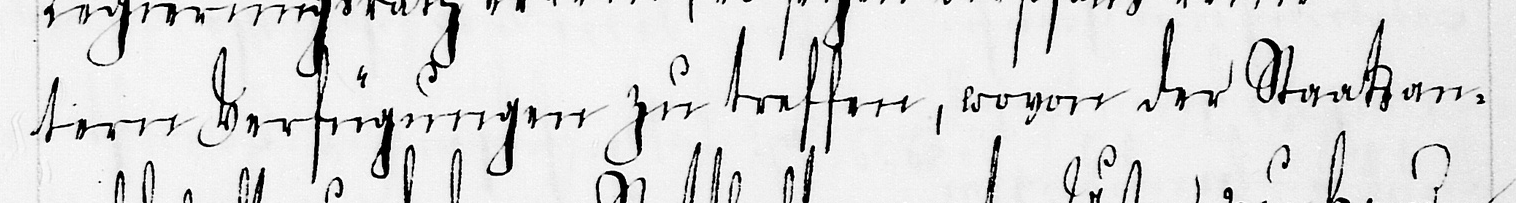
tern Verfügungen zu treffen, wovon der Staatsan¬
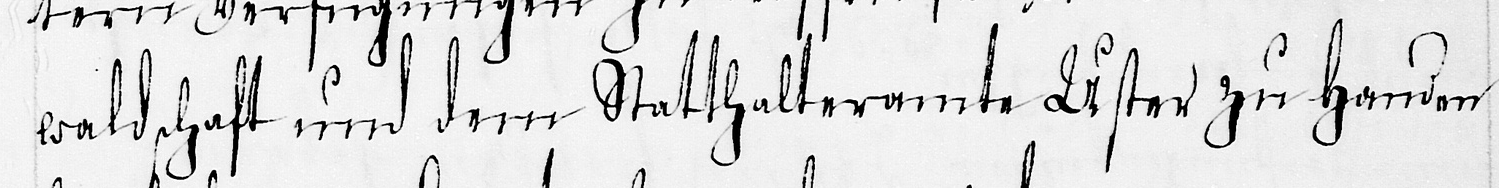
waldschaft und dem Statthalteramte Uster zu Handen
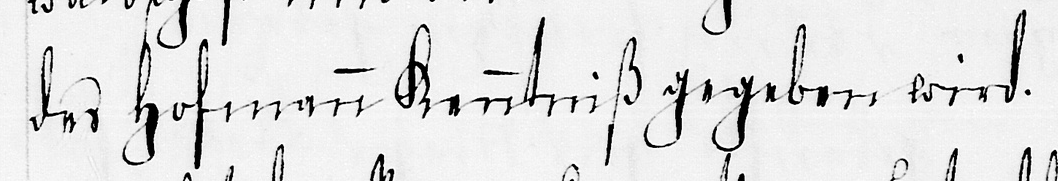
des Hofmann Kenntniß gegeben wird.
